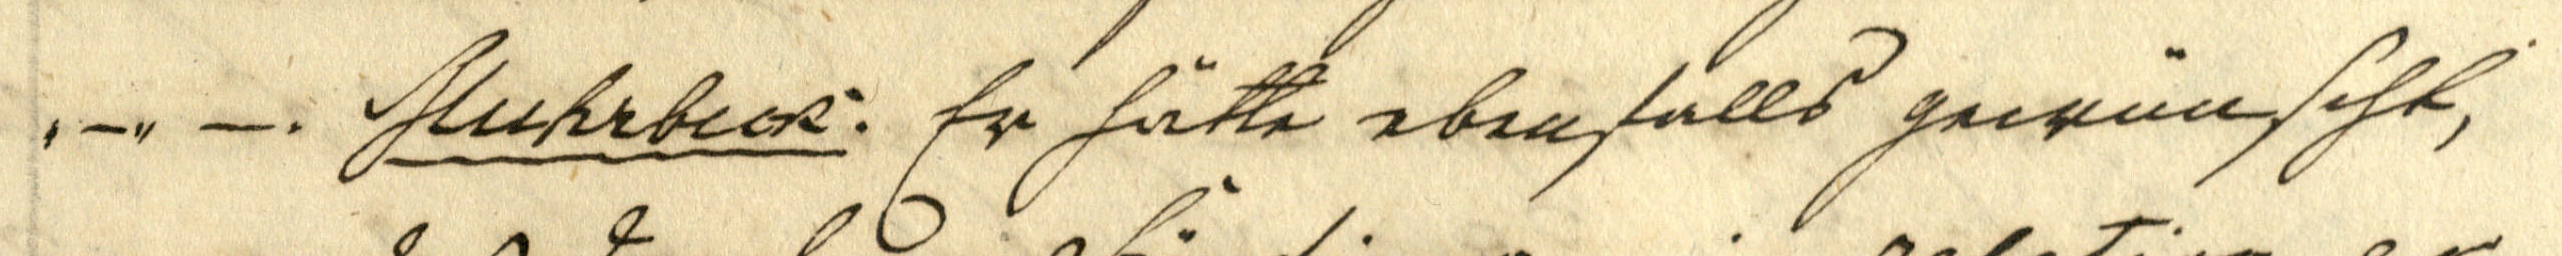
" - " - " Muhrbeck: Er hätte ebenfalls gewünscht,
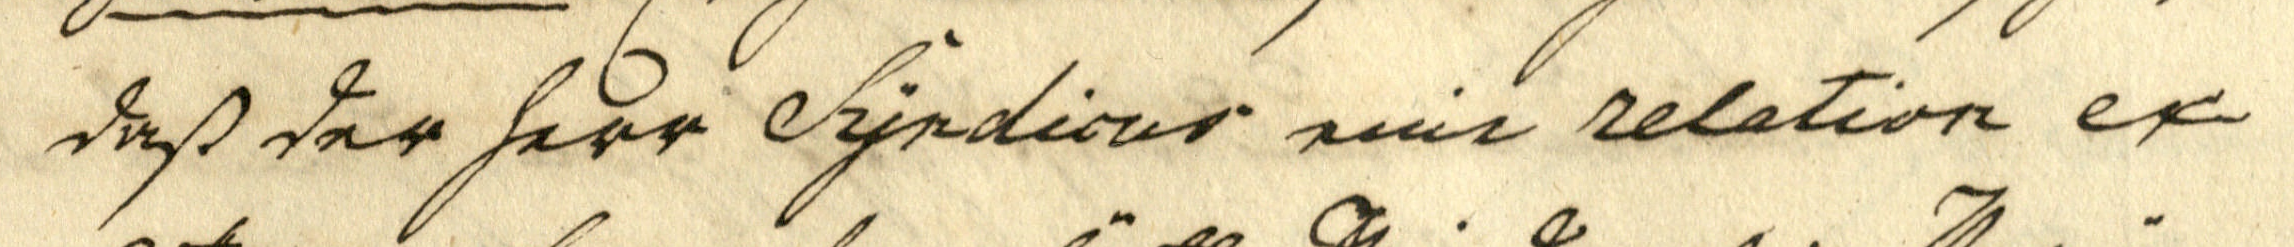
daß der Herr Syndicus eine relation ex
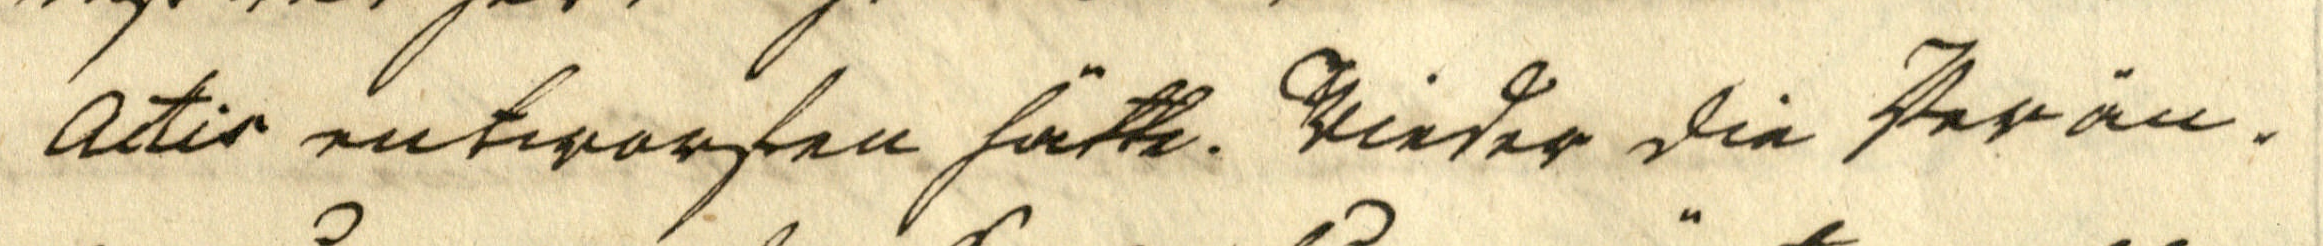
Actis entworfen hätte. Wieder die Veränd-
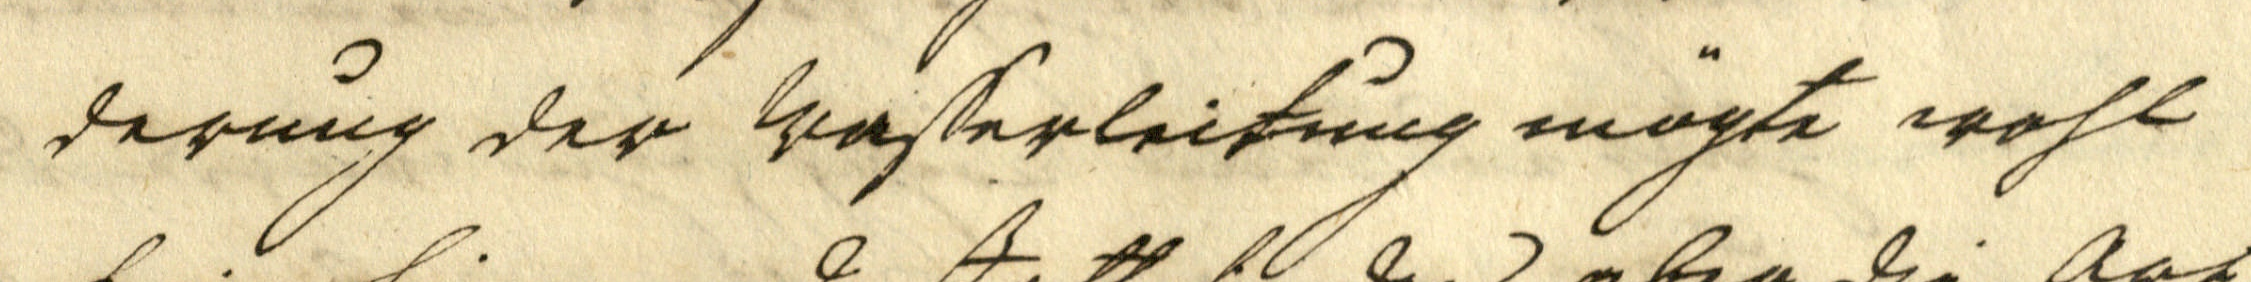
derung der Wasserleitung mögte wohl
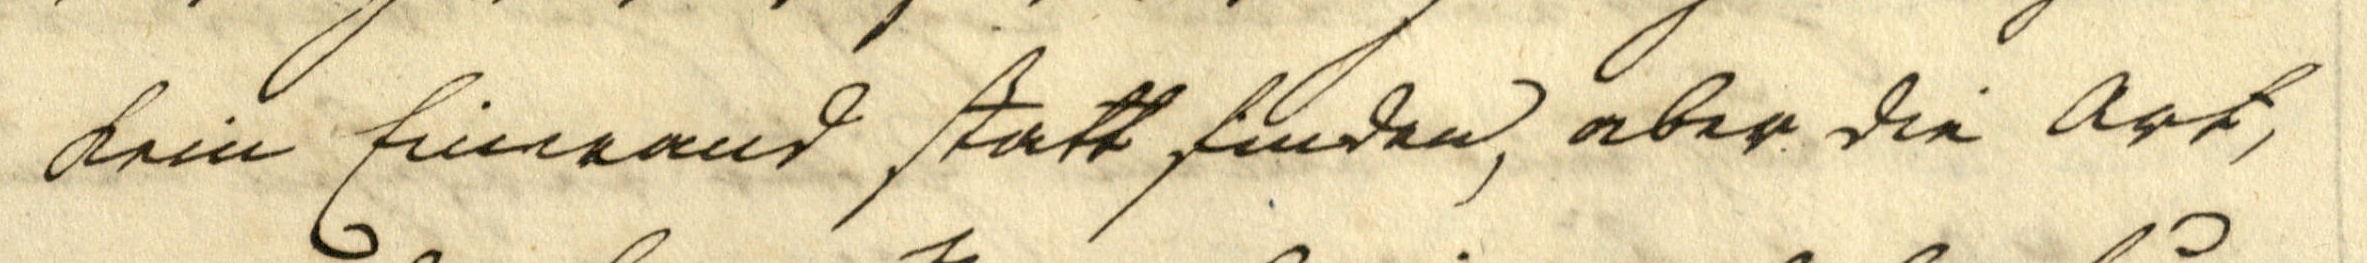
kein Einwand stattfinden, aber die Art,
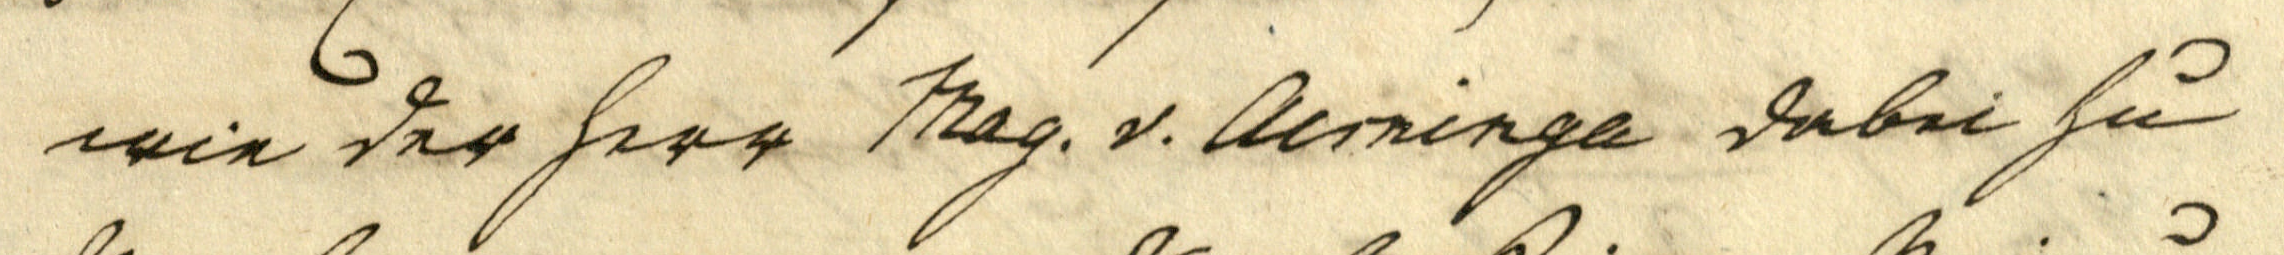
wie der Herr Mag. v. Aeminga dabei zu
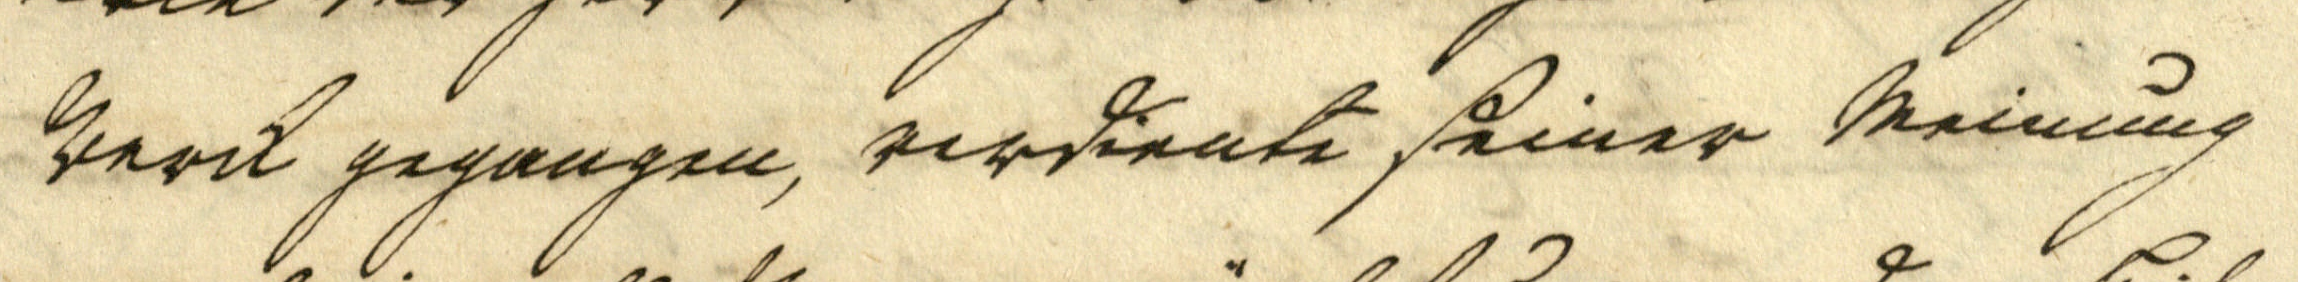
Werck gegangen, verdiente seiner Meinung
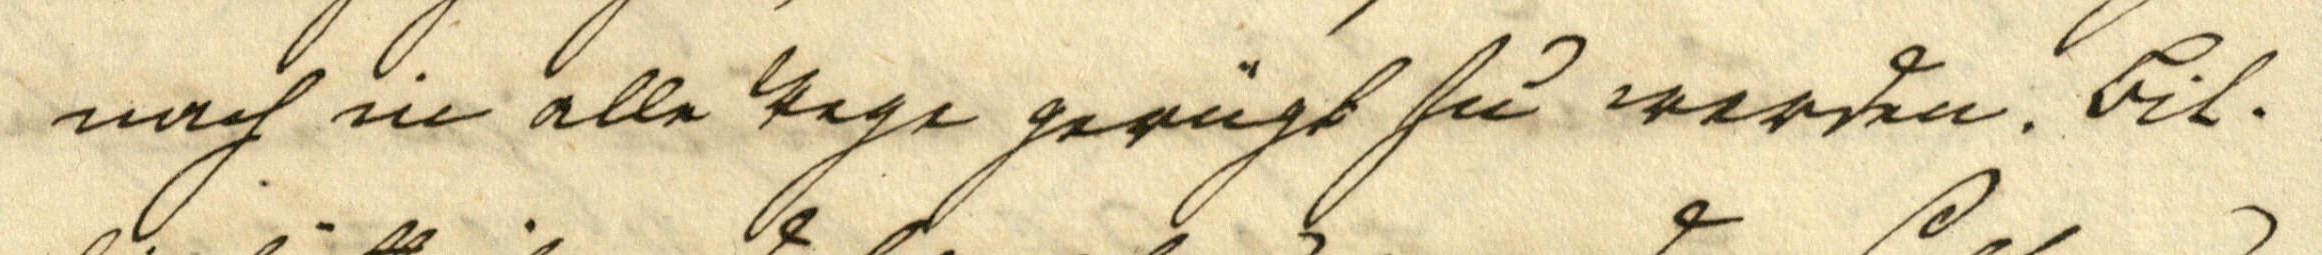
nach in alle Wege gerügt zu werden. Bil-
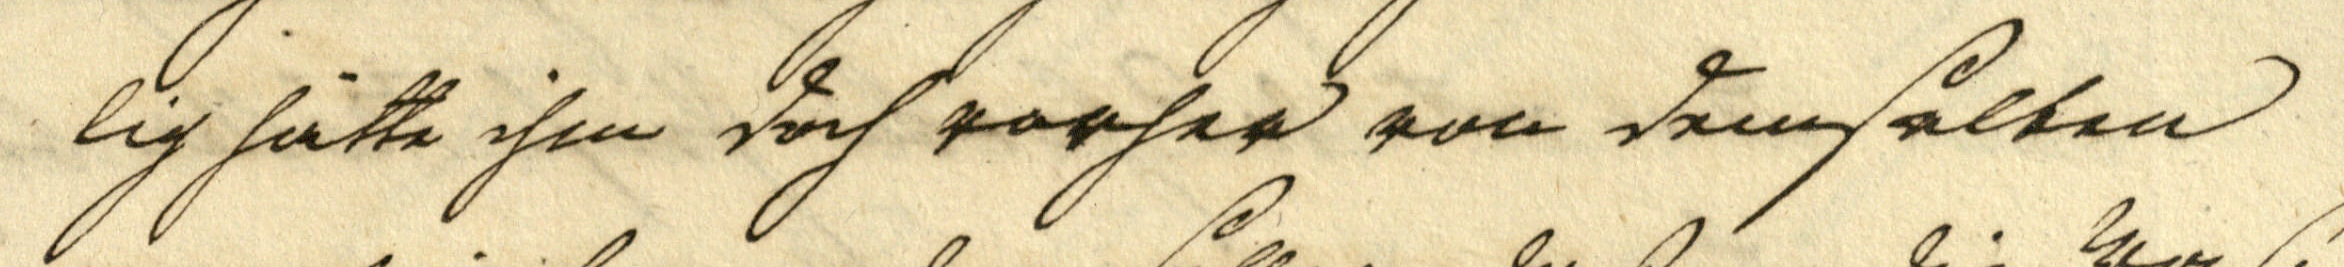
lig hätte ihm doch vorher von demselben
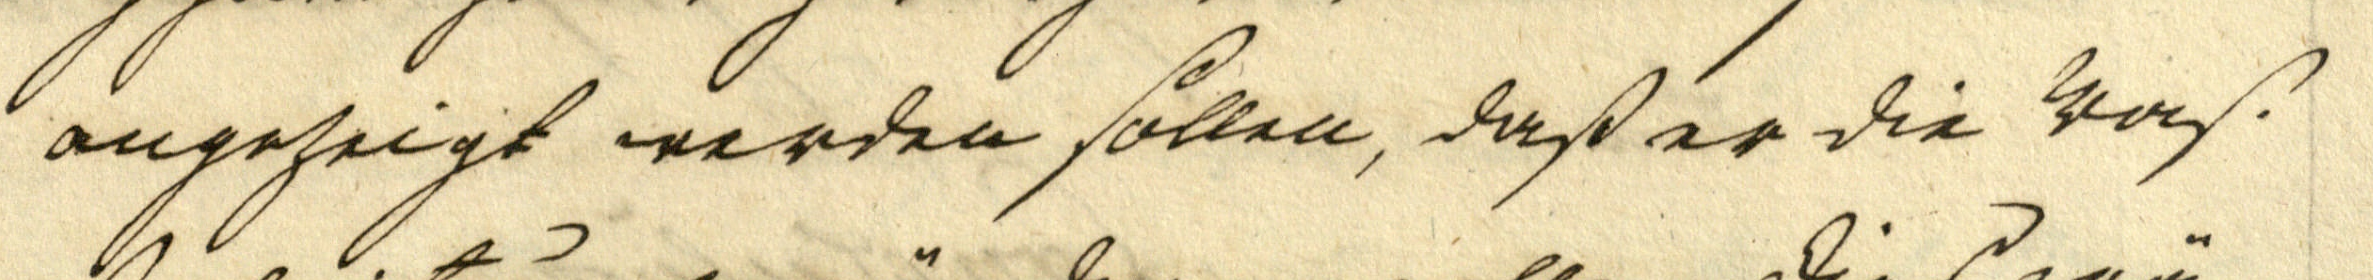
angezeigt werden sollen, daß er die Was-
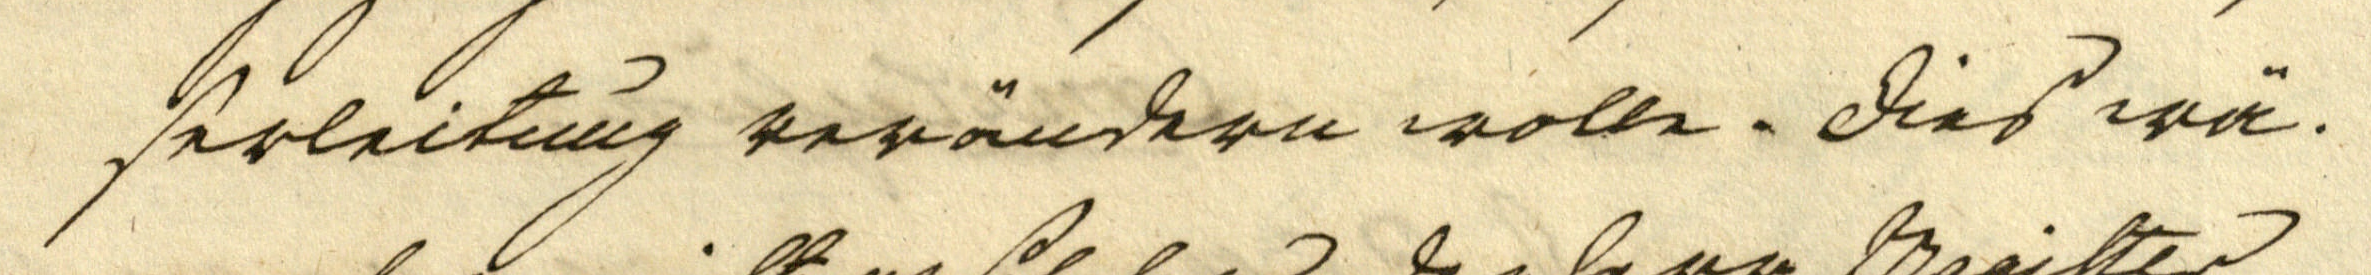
serleitung verändern wolle. Dies wä-
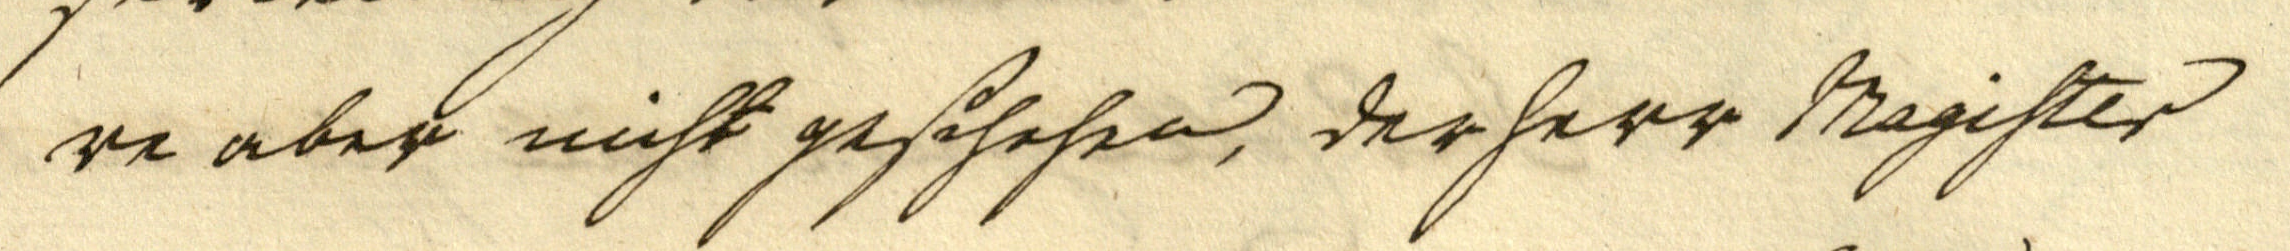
re aber nicht geschehen, der Herr Magister
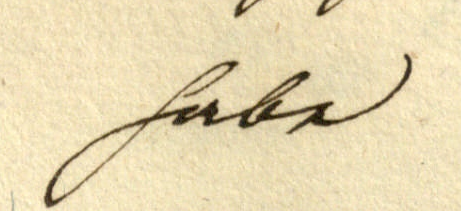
habe
